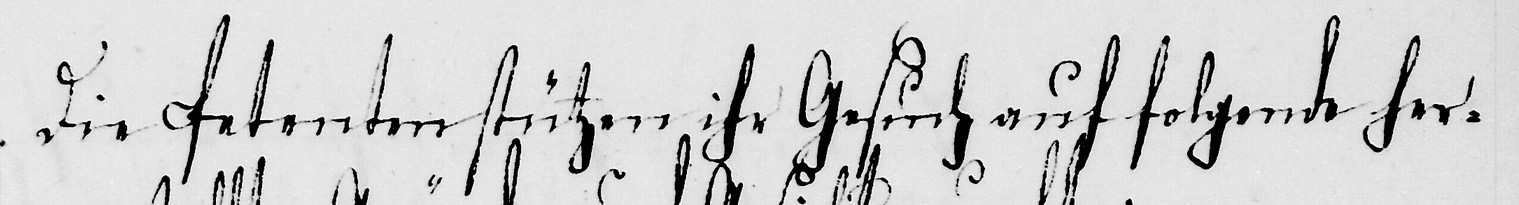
Die Petenten stützen ihr Gesuch auf folgende her¬
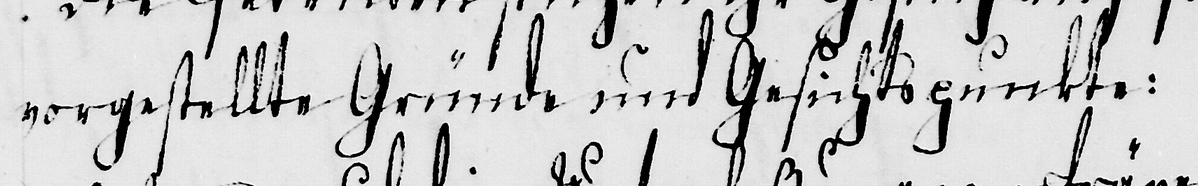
vorgestellte Gründe und Gesichtspunkte:
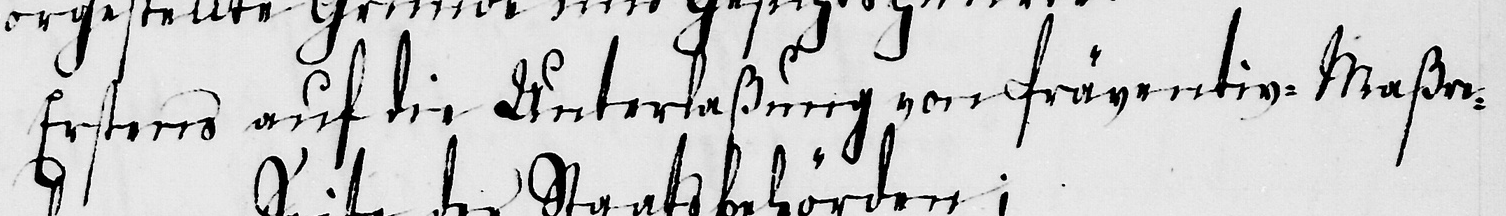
Erstens auf die Unterlaßung von Präventiv-Maßre¬
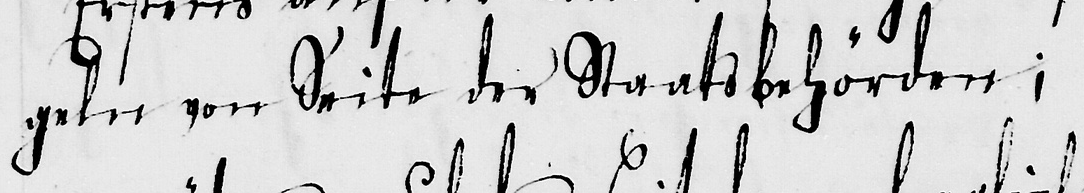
geln von Seite der Staatsbehörden;
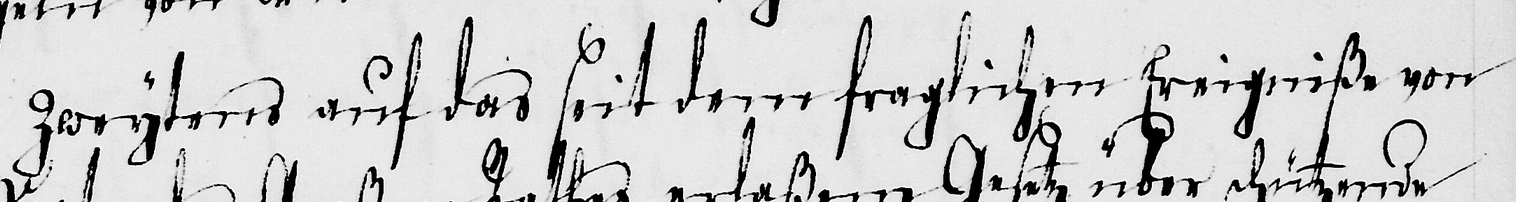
Zweytens auf das seit dem fraglichen Ereigniße von
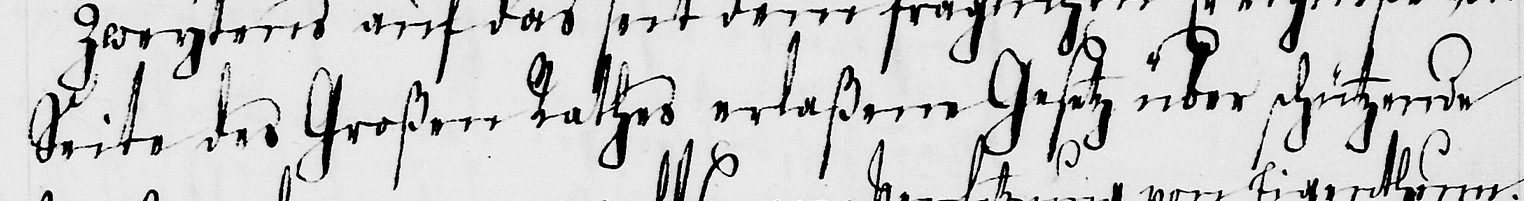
Seite des Großen Rathes erlaßene Gesetz über schützende
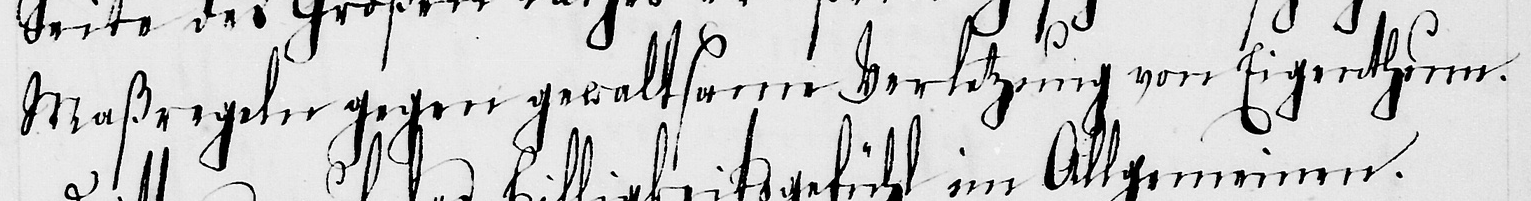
Maßregeln gegen gewaltsame Verletzung von Eigenthum.
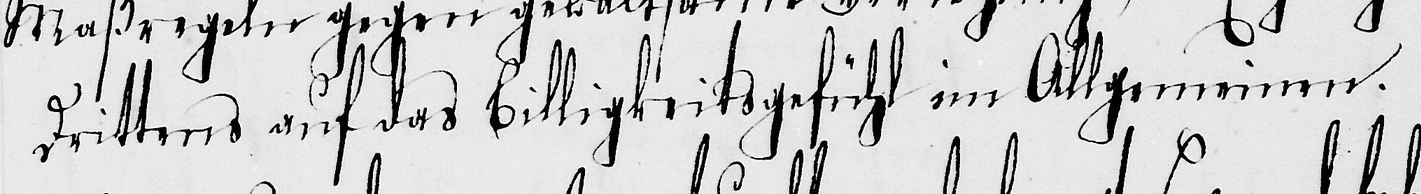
Drittens auf das Billigkeitsgefühl im Allgemeinen.
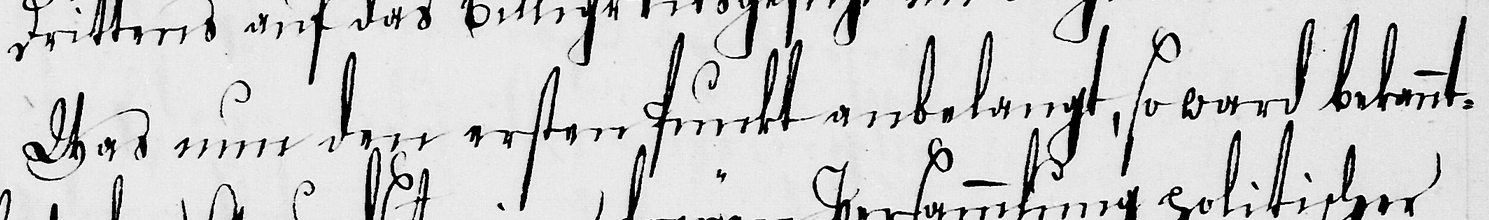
Was nun den ersten Punkt anbelangt, so ward bekan¬
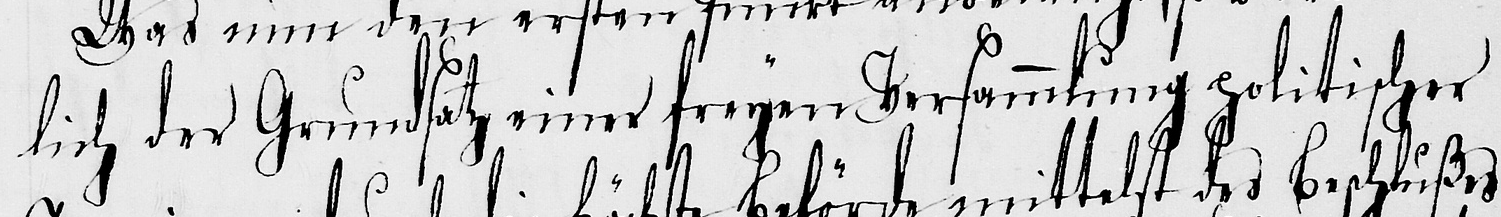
lich der Grundsatz einer freyen Versammlung politischer
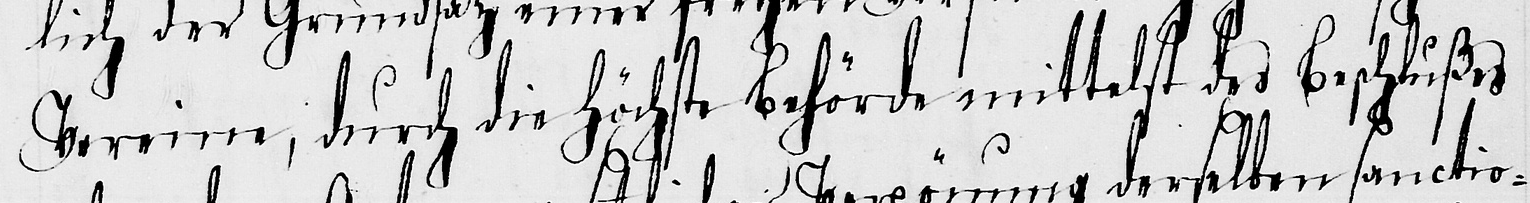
Vereine, durch die Höchste Behörde mittelst des Beschlußes
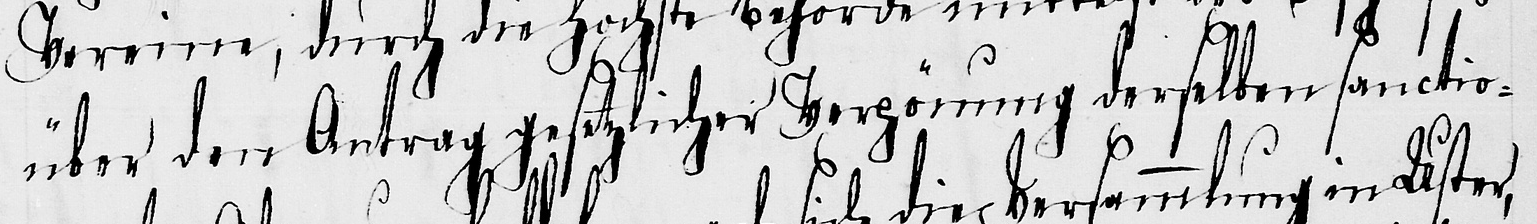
über den Antrag gesetzlicher Verpönung derselben sanctio¬
